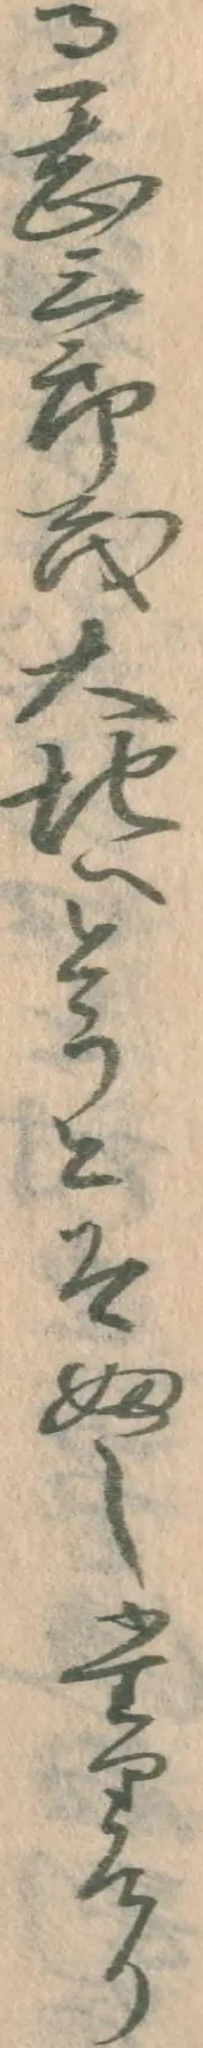る甚三郎茂大地へとうとそ婦し堂里けり
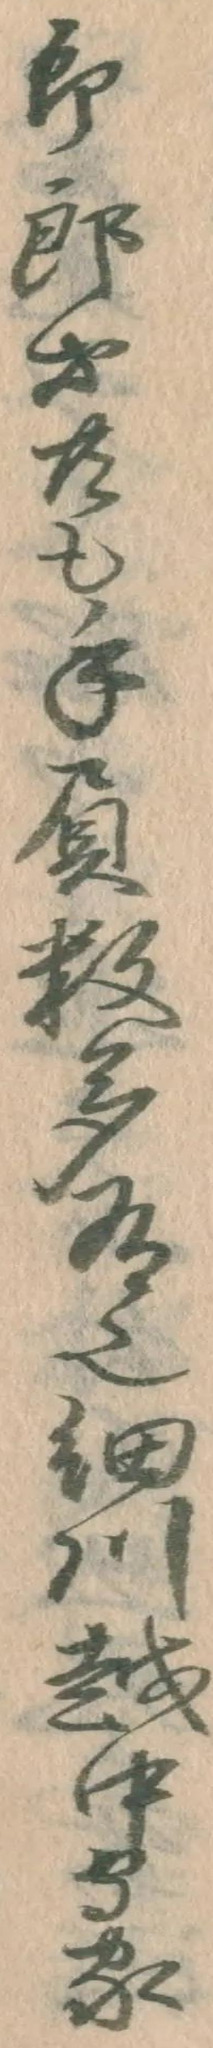郎郎等共も手負数多有也細川越中守家
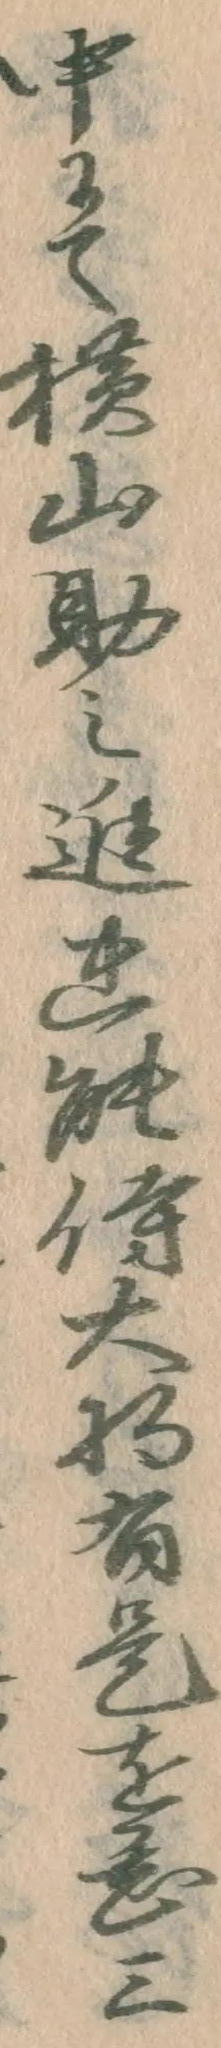中尓て横山助之進迚能侍大将有是を甚三
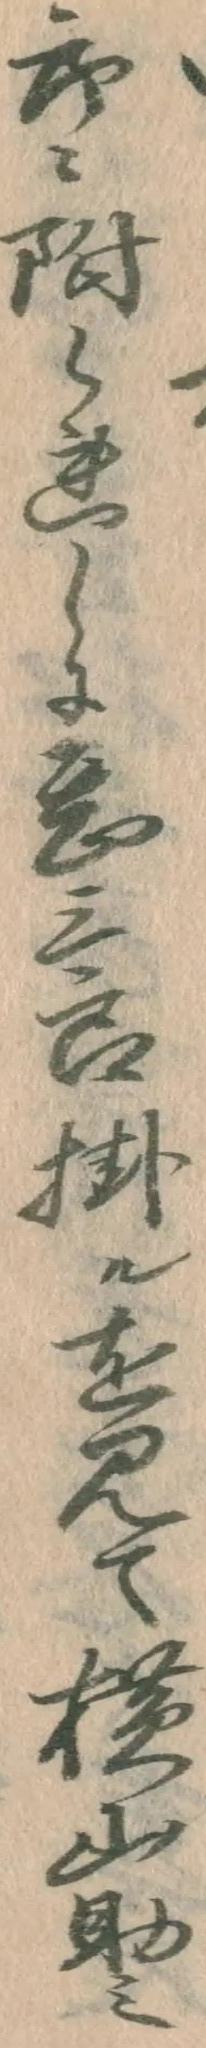郎に附ら連し尓甚三郎掛るを見て横山助之
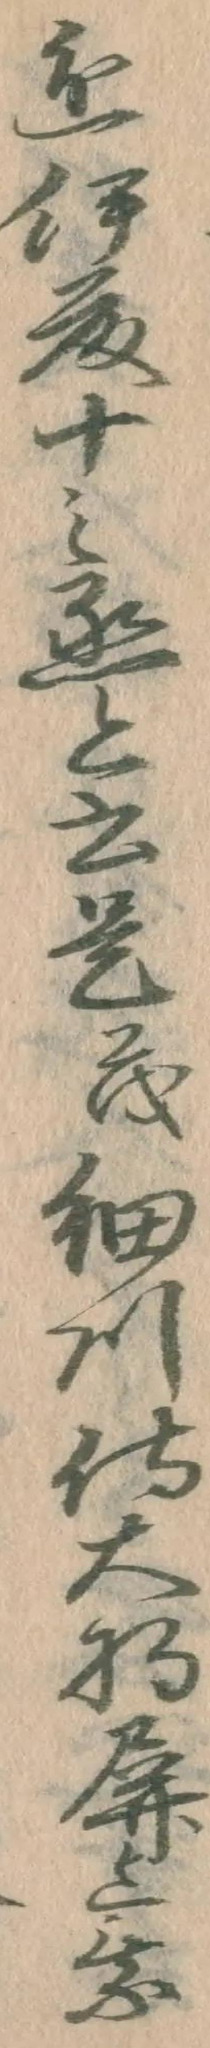進伊藤十之丞と云是茂細川侍大将屏迄乗
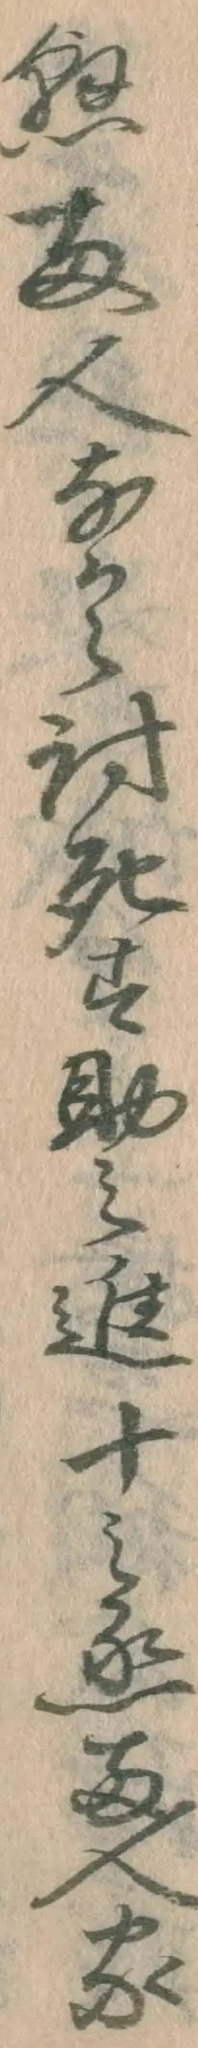懸両人なから討死春助之進十之丞両人家
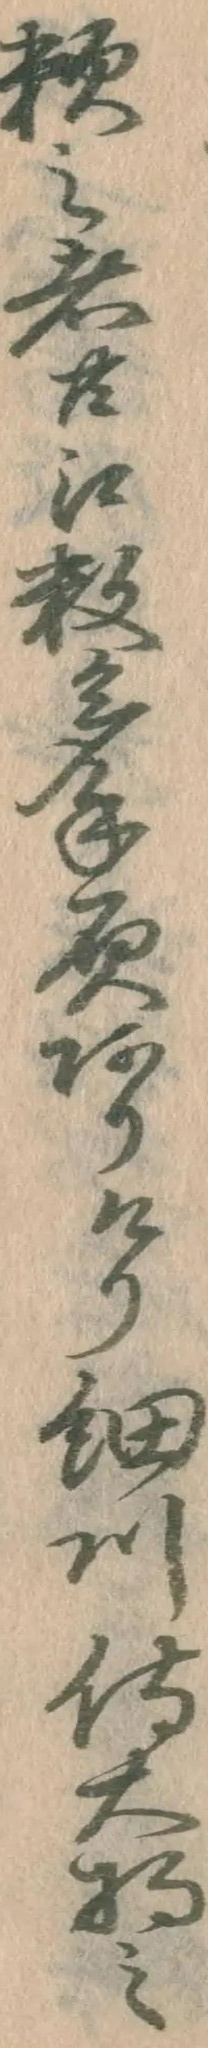頼之者共江数多手負阿りけり細川侍大将之
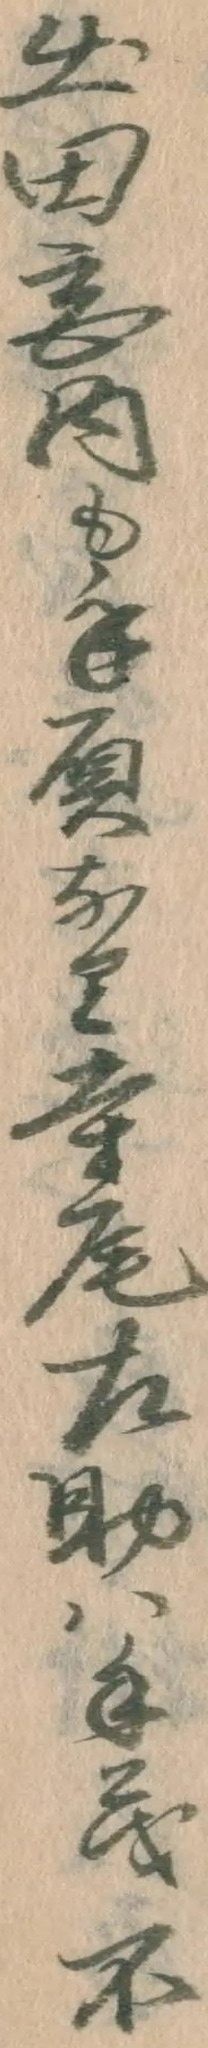出田宮内も手負な里寺尾左助は手茂不
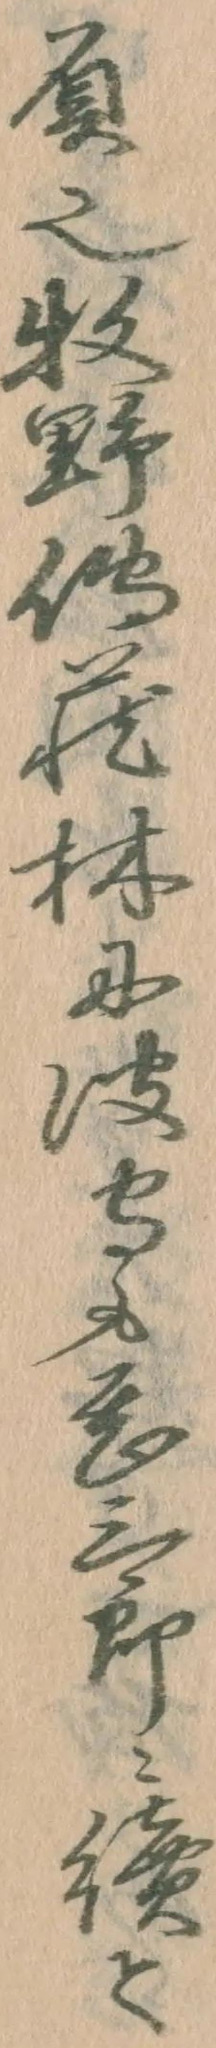負也牧野伝蔵林丹波守も甚三郎に続て
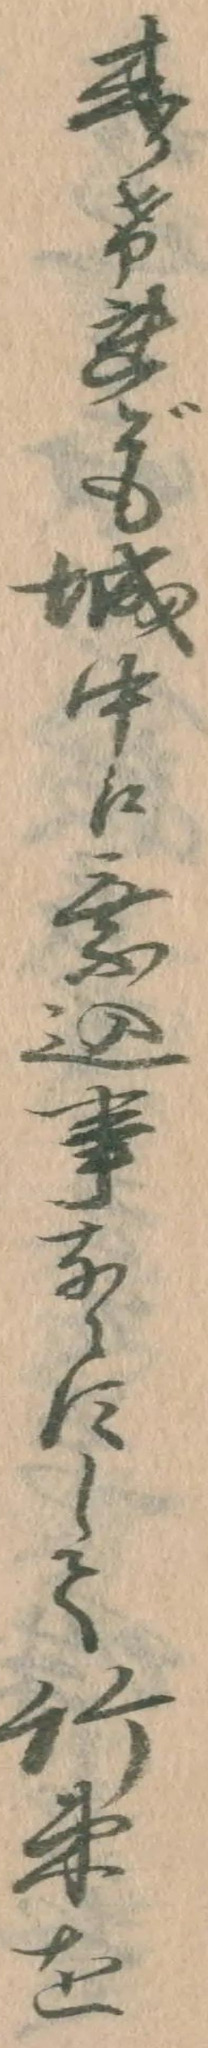来希連ども城中江乗込事なら須して竹束を
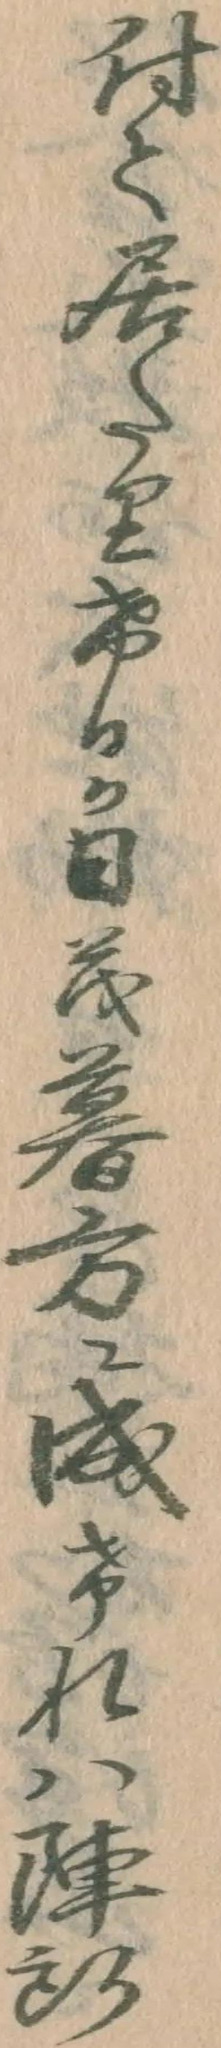付て居た里希るか日茂暮方に成希れは陣所
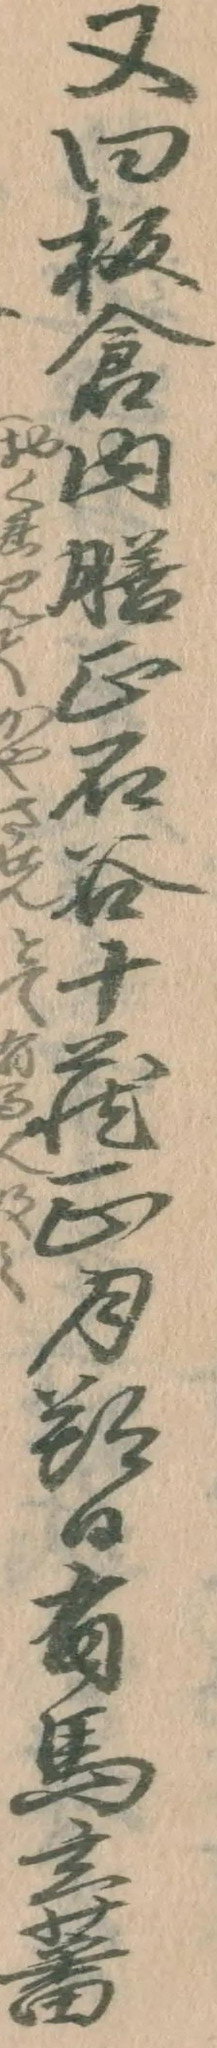又曰板倉内膳正石谷十蔵正月朔日有馬玄蕃
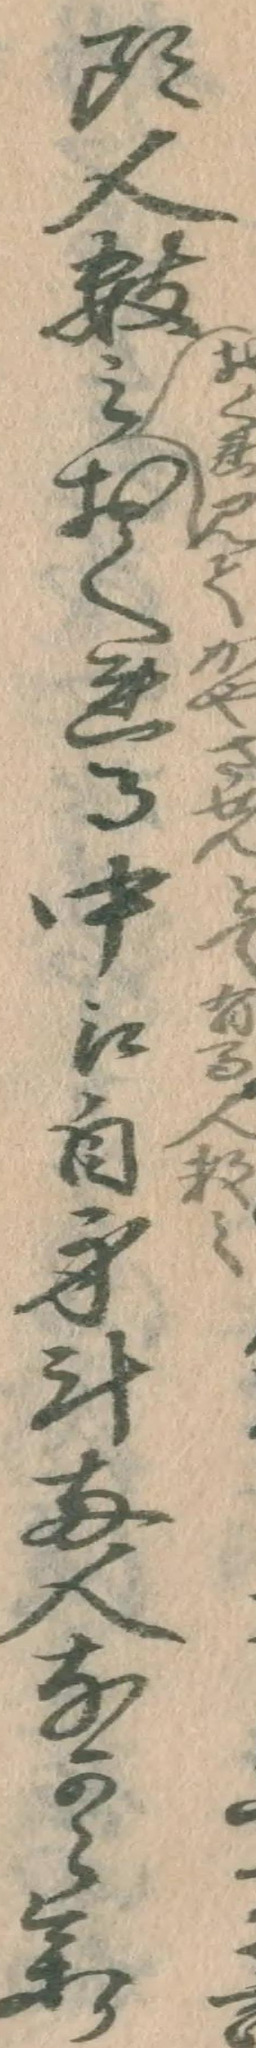頭人数之おく連る中江自身斗両人な可ら参り
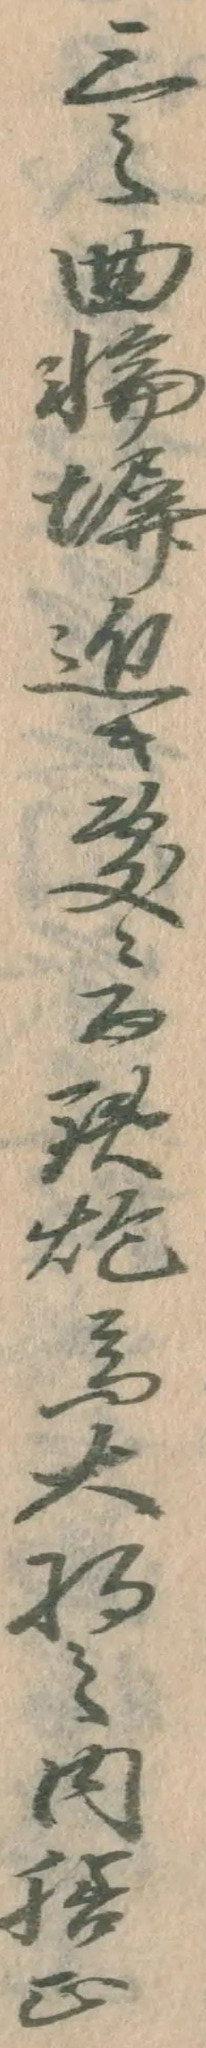三之曲輪塀近き處に而鉄炮に而大将之内膳正
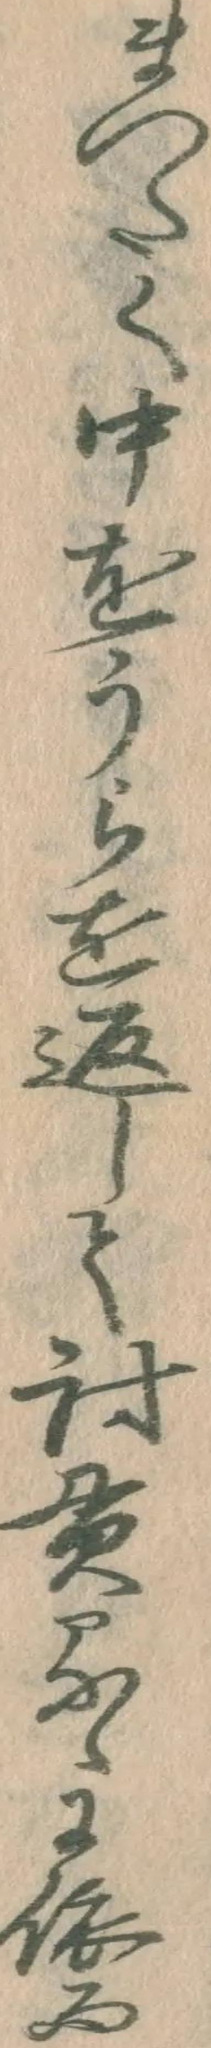まつたく中をうらを返して討貫るゝ尓依而
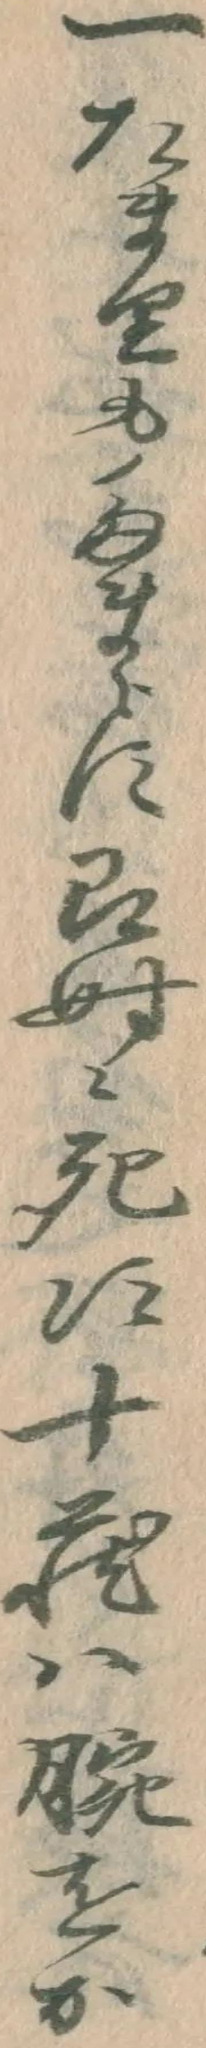一たま里も多まら須即時に死須十蔵は腕をか
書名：切支丹御退治記 49巻. [5]
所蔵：国立国会図書館 National Diet Library, JAPAN
